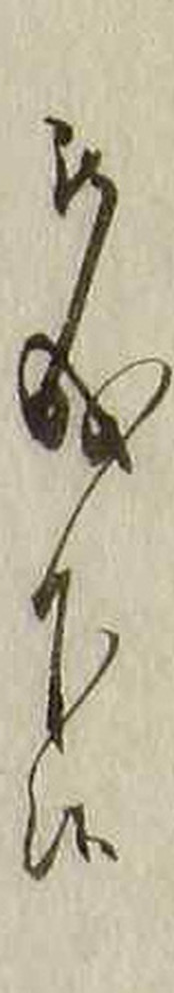被成下候
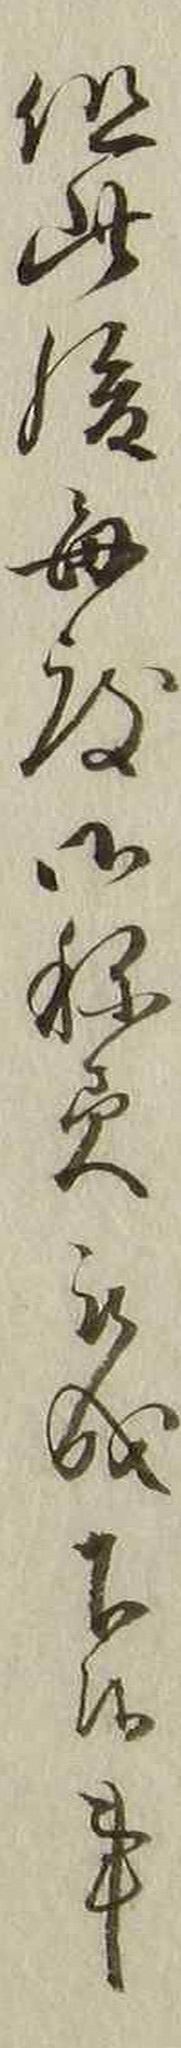但此後毎度御称美被成下候事
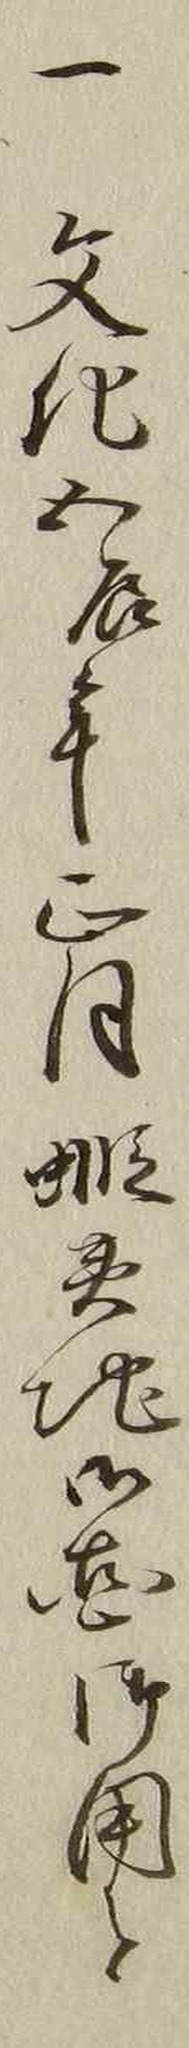一文化五辰年正月蝦夷地御固御用と
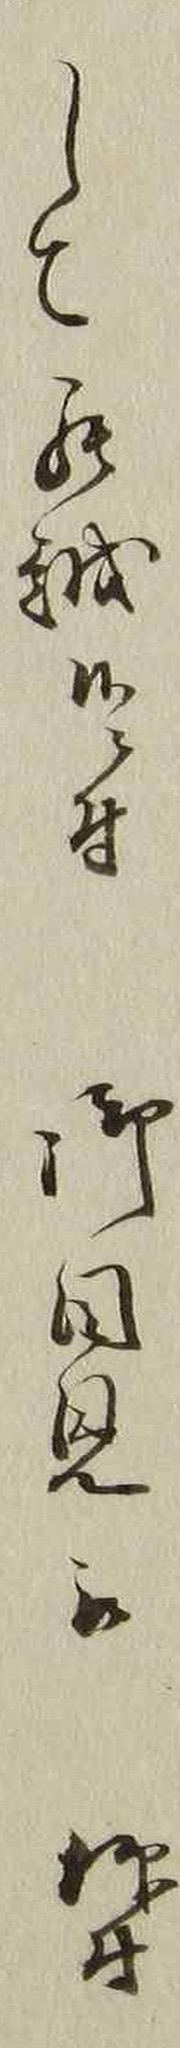して罷越候ニ付御目見被仰付
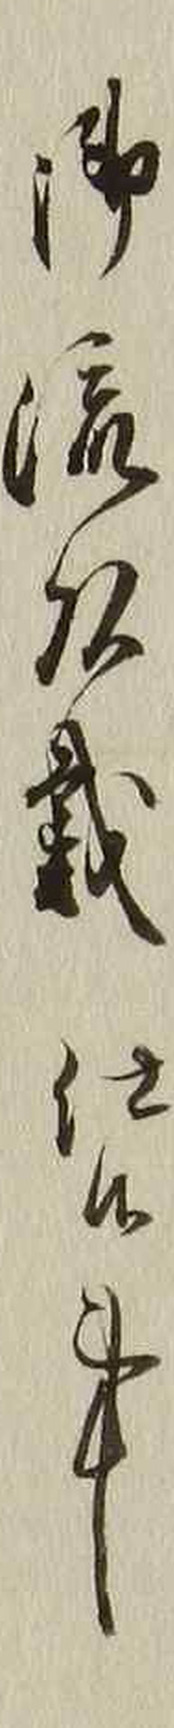御流頂戴仕候事
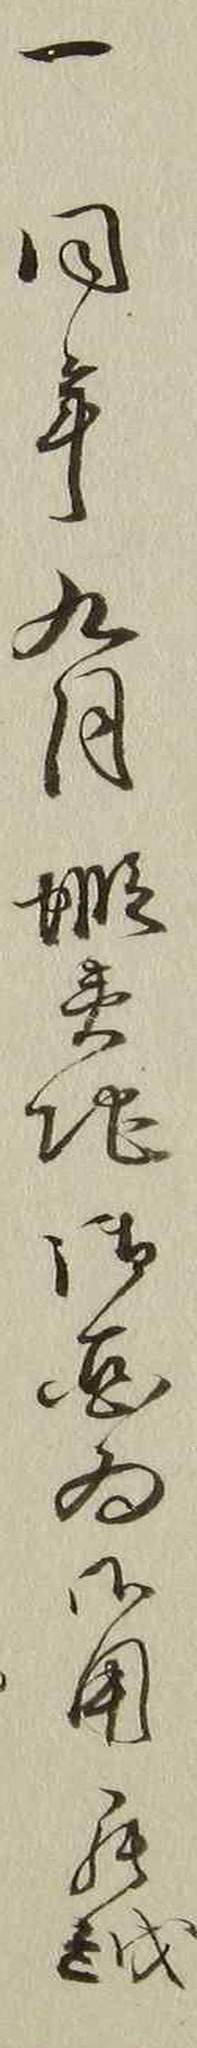一同年九月蝦夷地御固為御用罷越
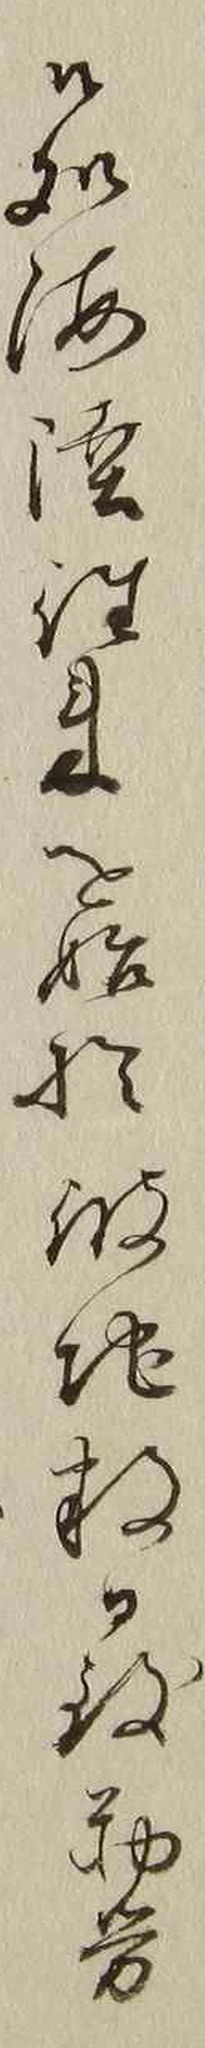候処海陸往来を始於彼地数日致勤労
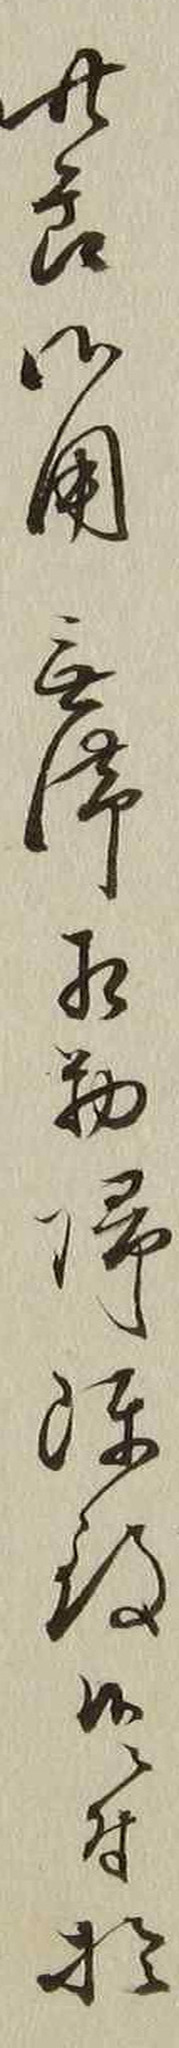此節御用無滞相勤帰陣致候ニ付於
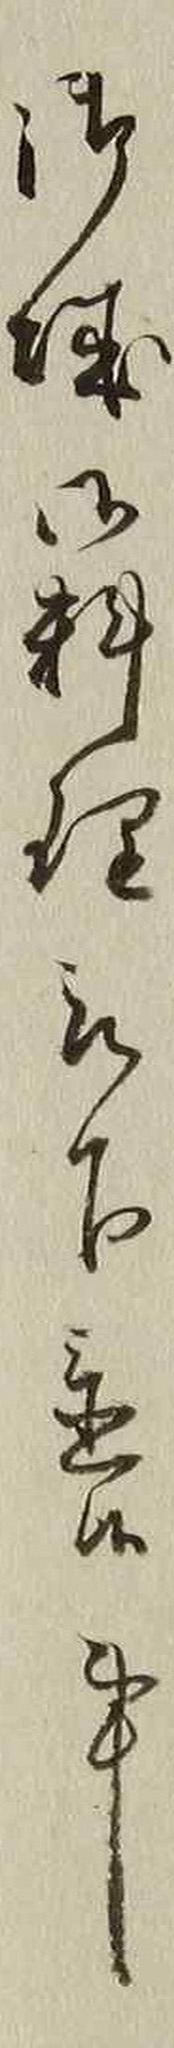御城御料理被下置候事
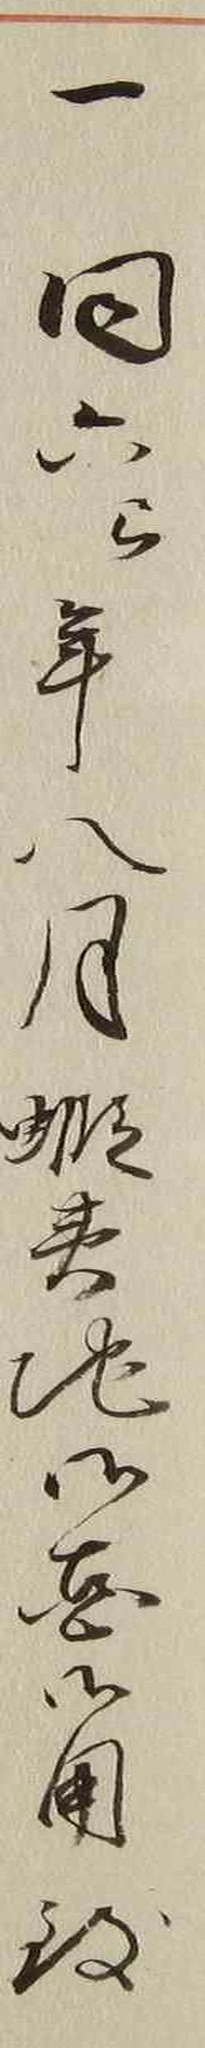一同六巳年八月蝦夷地御固御用致
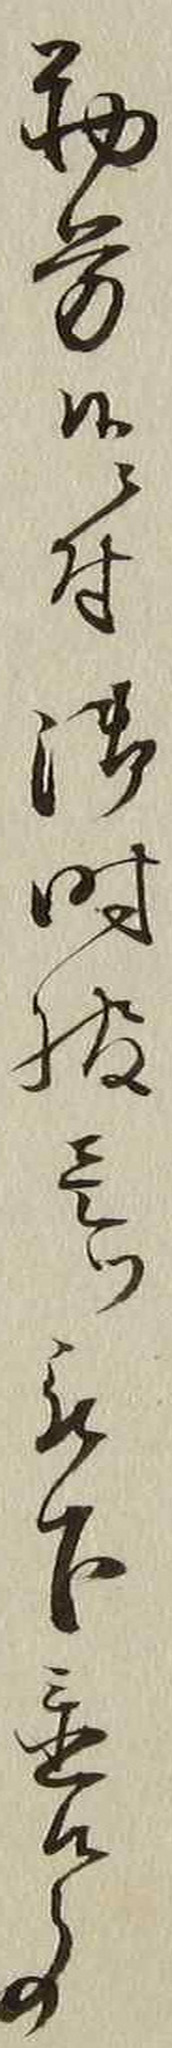勤労候ニ付御時服壱ツ被下置候事
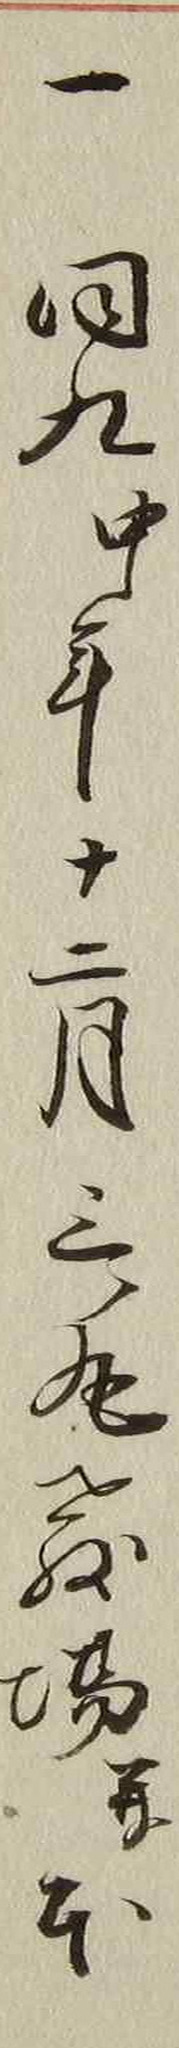一同九申年十二月三ノ丸教場并本
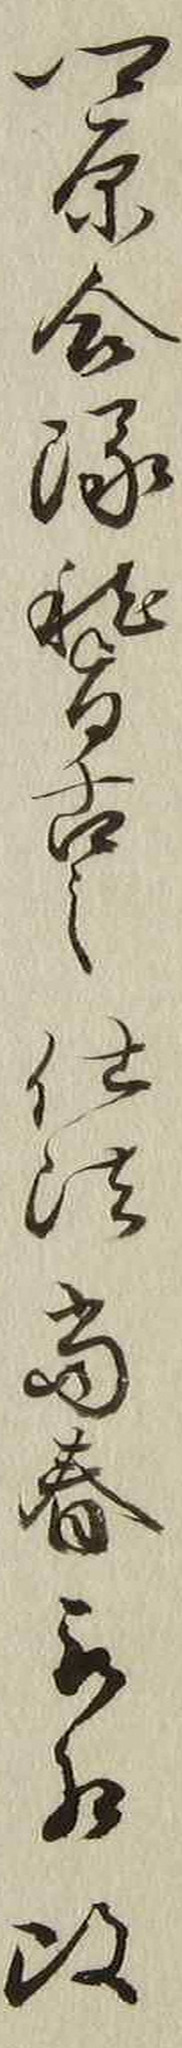郷原合隊稽古之仕法当春被相改
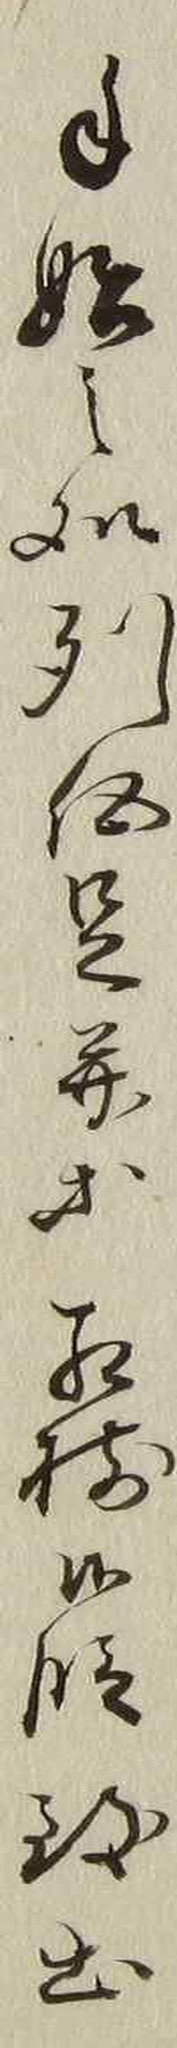手始之処列伍足並等相揃候段致出
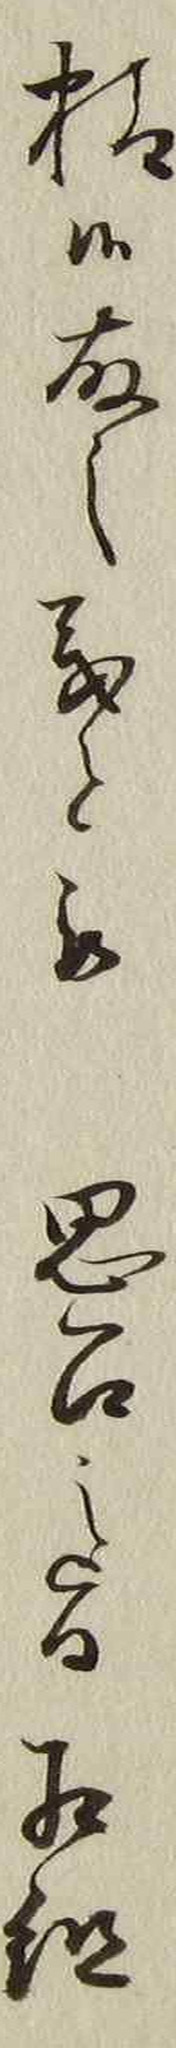精候故之儀と被思召之旨相組
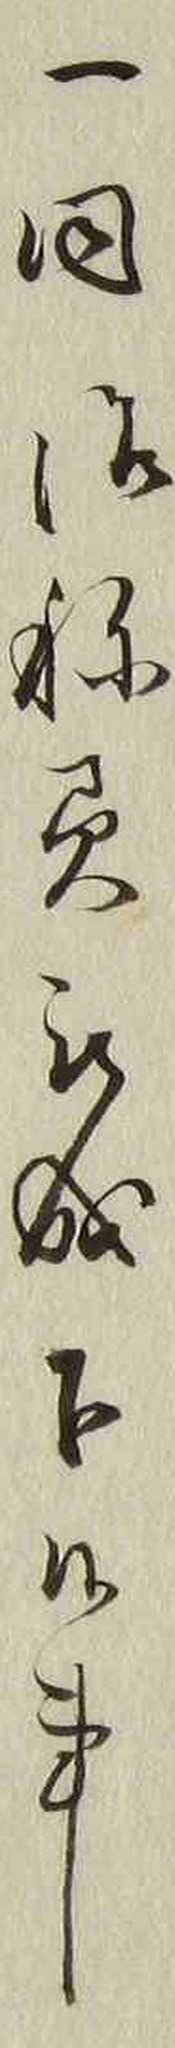一同御称美被成下候事
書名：諸士系譜　巻之26　い之部26
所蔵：会津若松市立会津図書館
